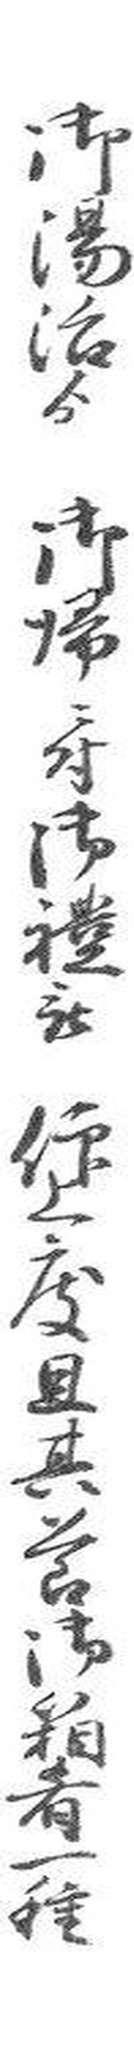御湯治ゟ御帰ニ付御礼被仰上度且其節御箱肴一種
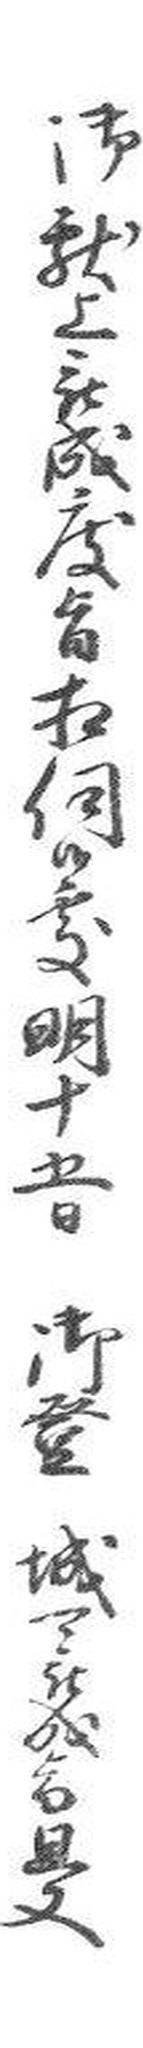御献上被成度旨相伺候処明十五日御登城可被成旨且又
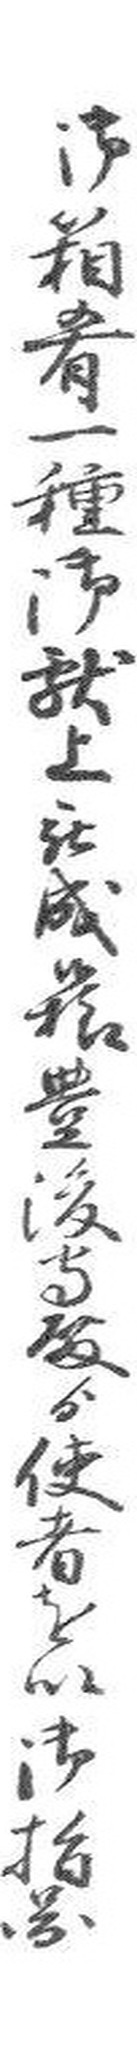御箱肴一種御献上被成候様豊後守殿ゟ使者を以御指図
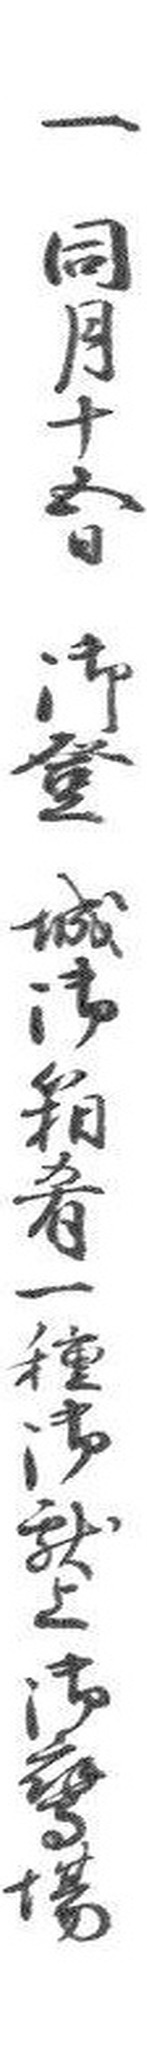一同日十五日御登城御箱肴一種御献上御鷹場
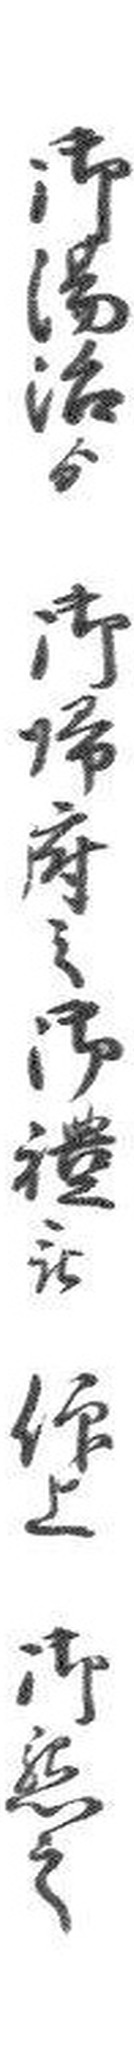御湯治ゟ御帰府之御礼被仰上御懇之
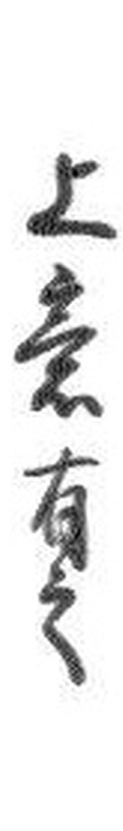上意有之
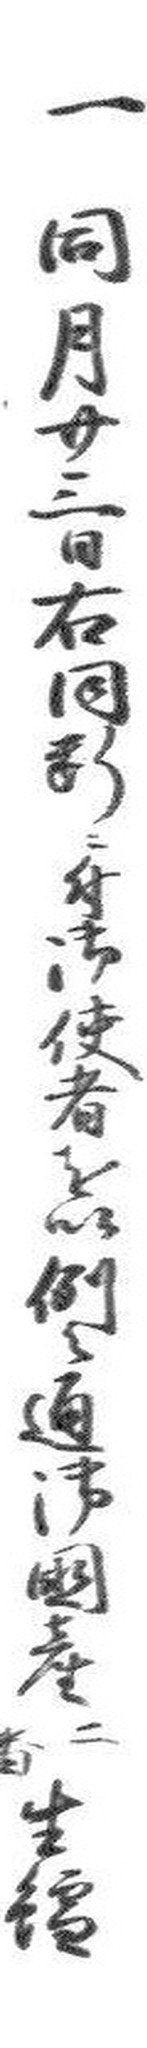一同月廿三日右同断ニ付御使者を以例之通御国産二番生鱈
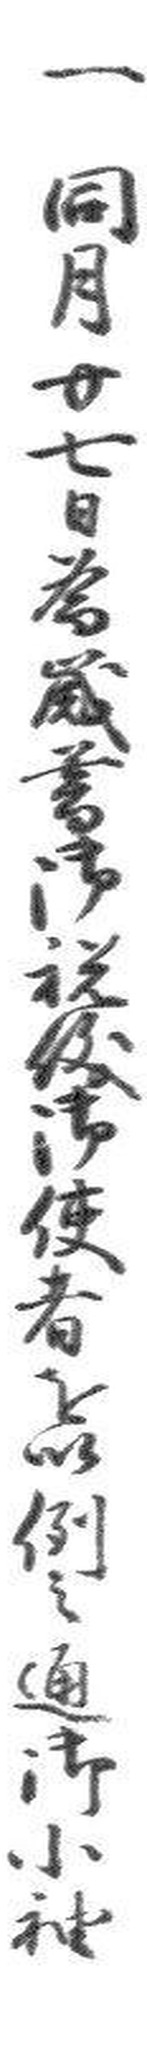一同月廿七日為歳暮御祝儀御使者を以例之通御小袖
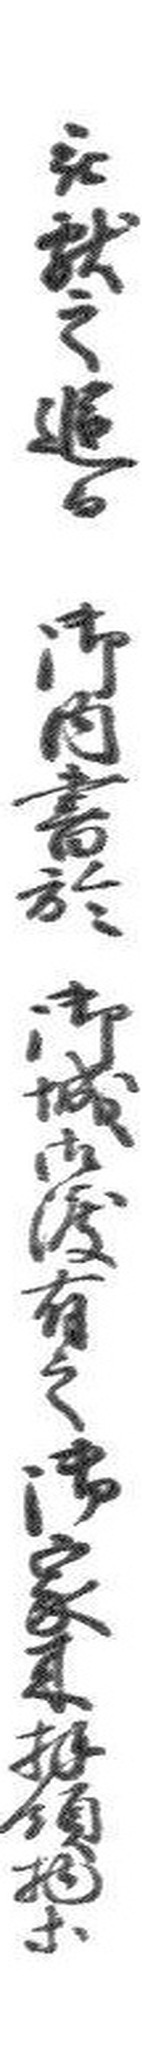被献之追而御内書於御城御渡有之御家来拝領物等

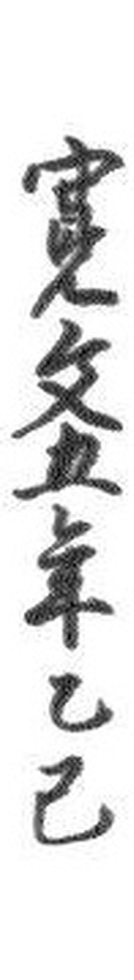寛文五年乙巳
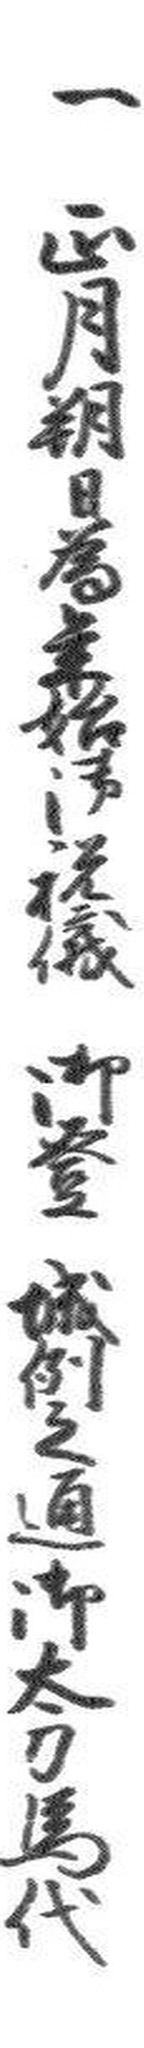一正月朔日為年始御祝儀御登城例之通御太刀馬代
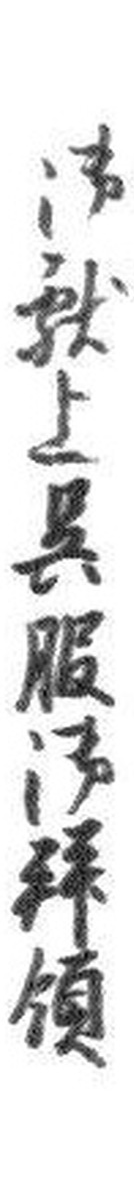御献上呉服御拝領
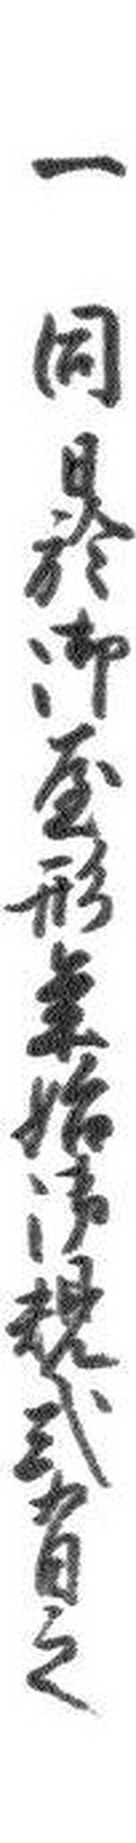一同日於御屋形年始御規式有之
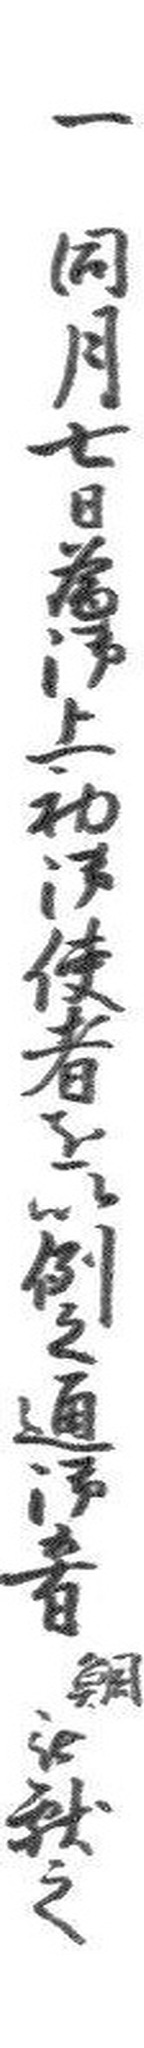一同月七日為御上初御使者を以例之通御肴鯛被献之

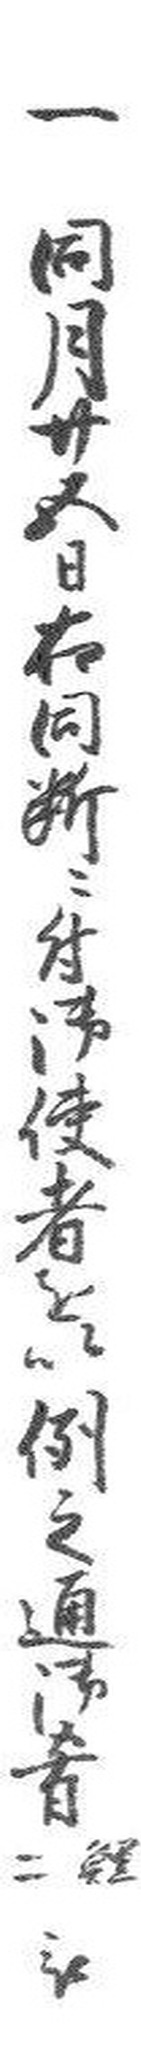一同月廿五日右同断ニ付御使者を以例之通御肴鯉ニ被
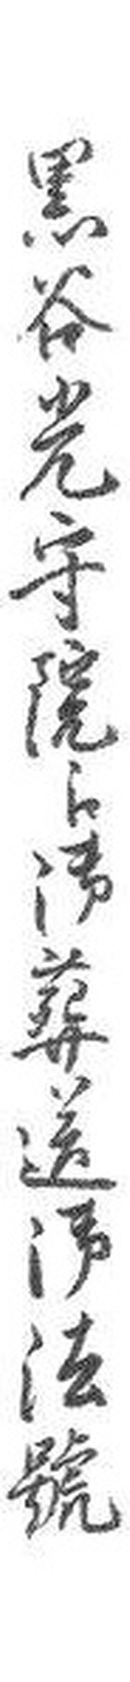黒谷光守院江御葬送御法号
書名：家譜 七 光通公 従寛文四年到同九年
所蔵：福井県文書館 Fukui Prefectural Archives
